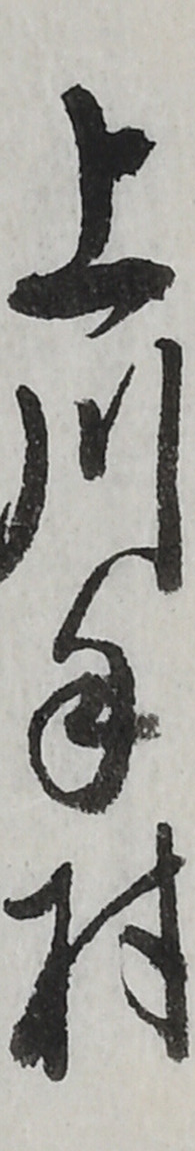上川手村
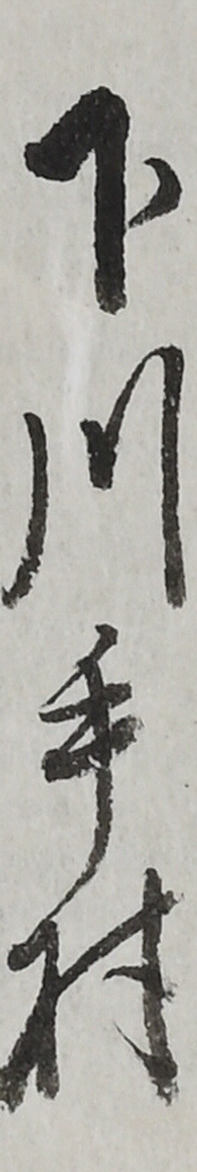下川手村
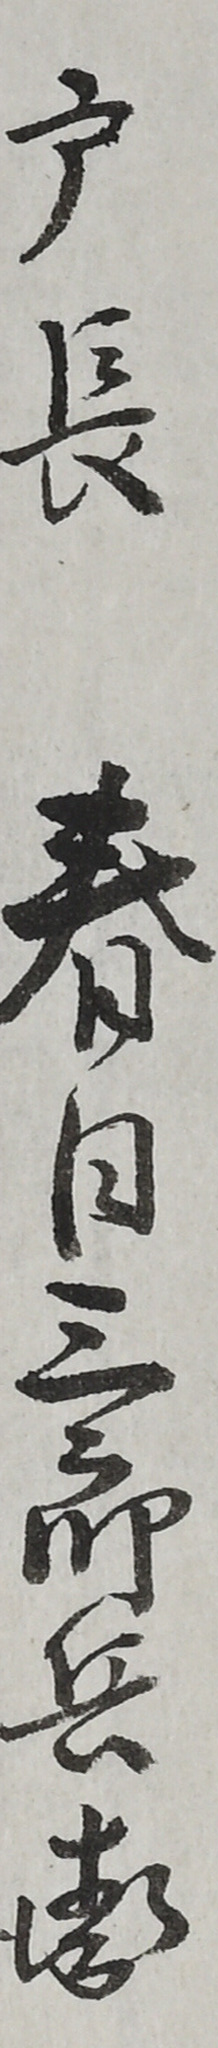戸長春日三郎兵衛
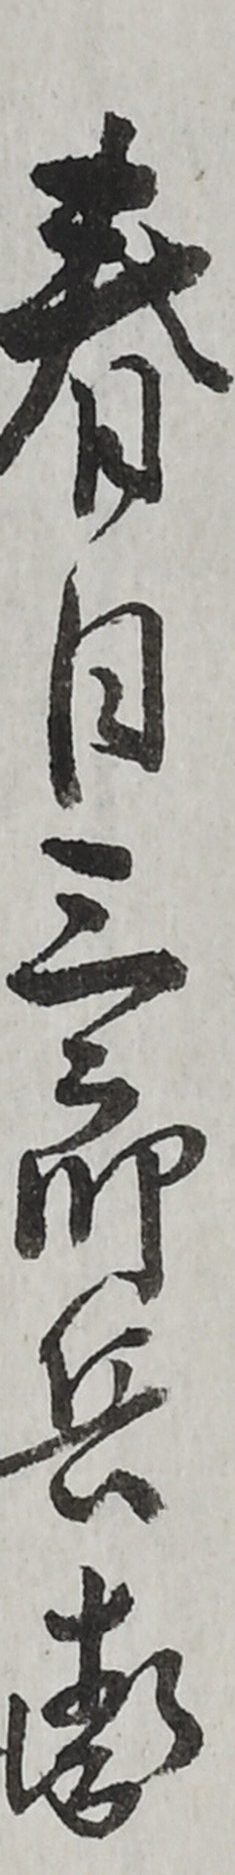戸長春日三郎兵衛
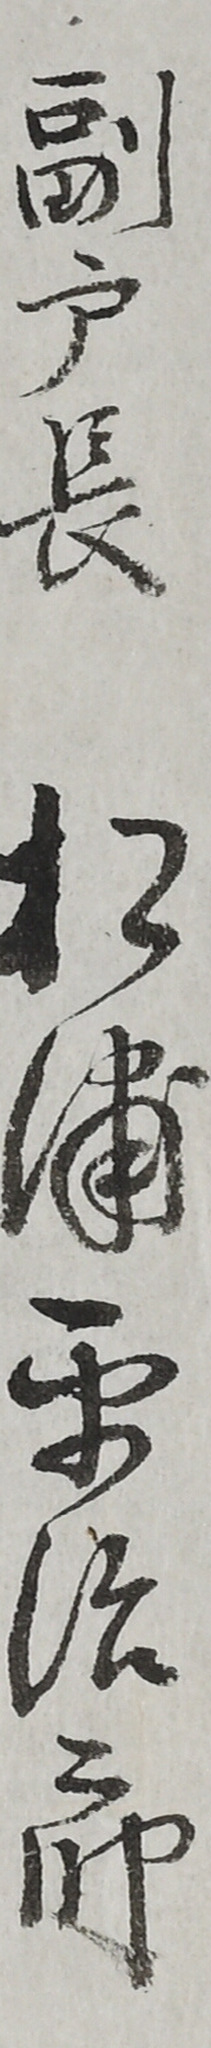副戸長松浦平治郎
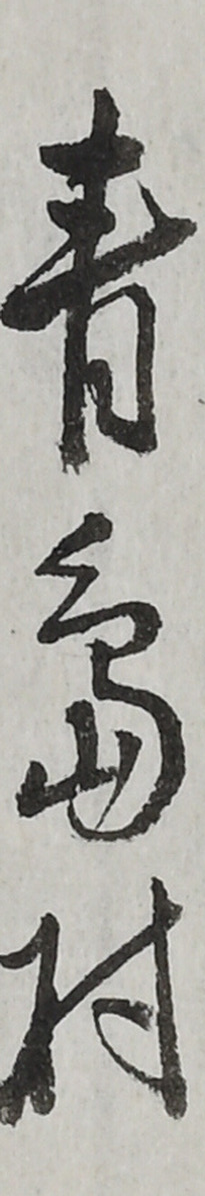青島村
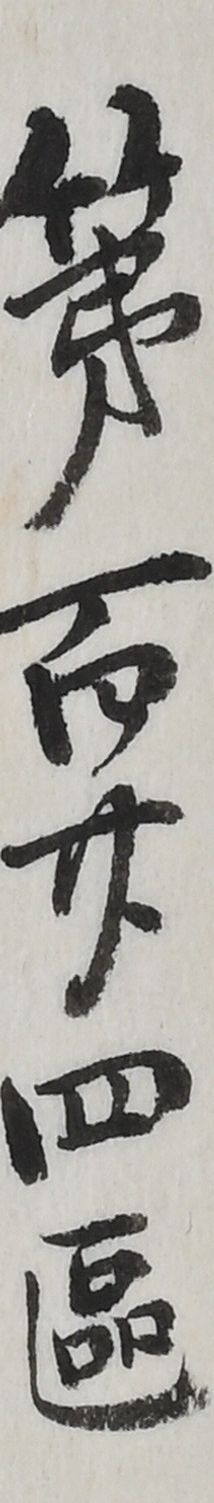第百廿四区
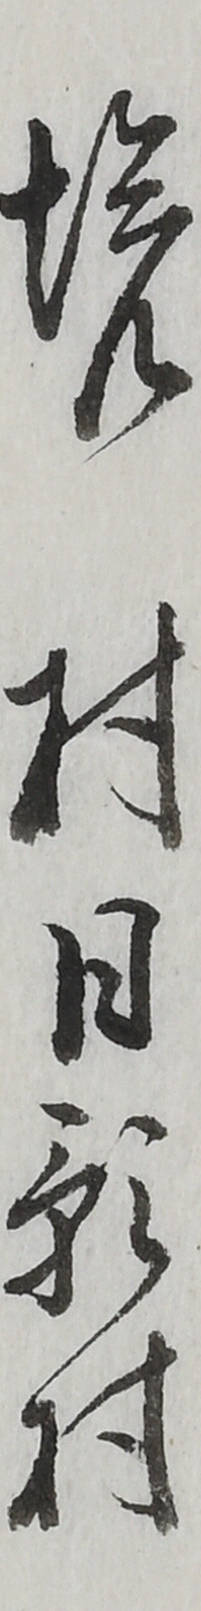境村日影村
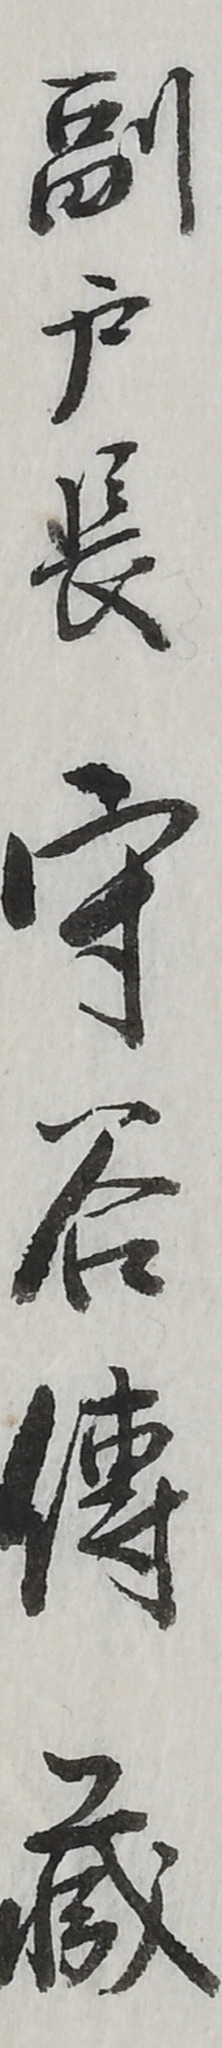副戸長守谷伝蔵
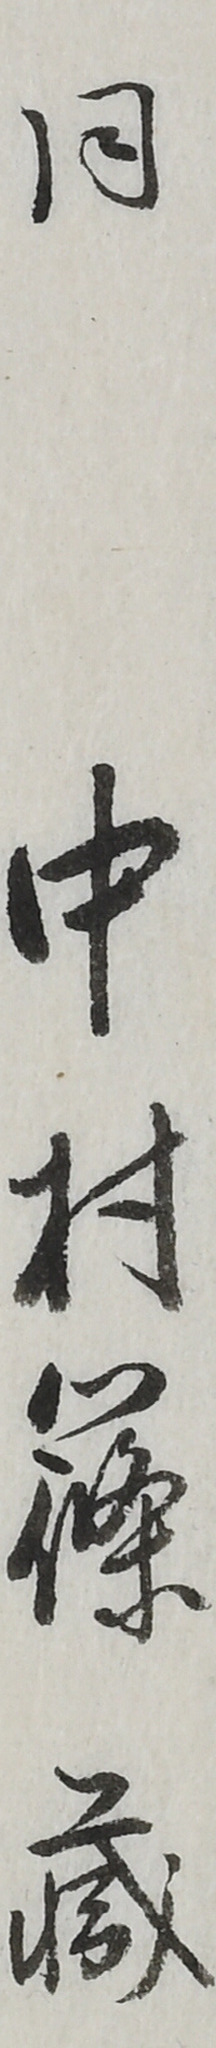同中村篠蔵
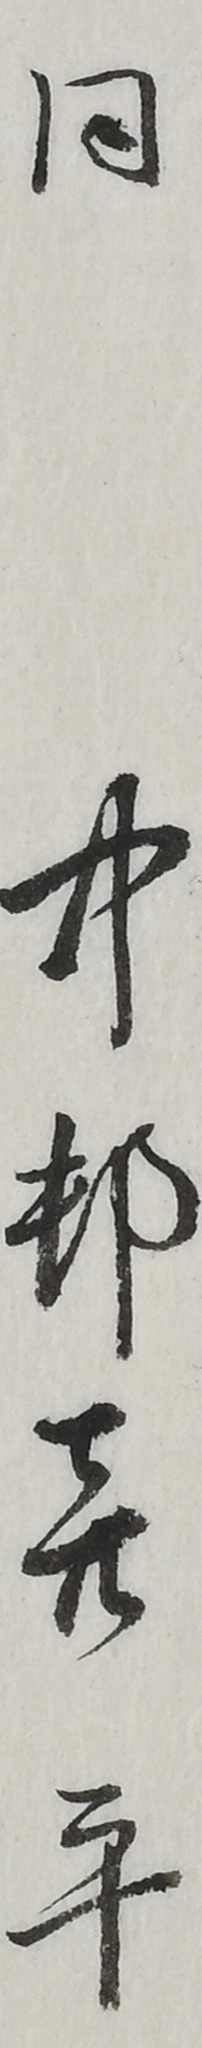同中邨喜平
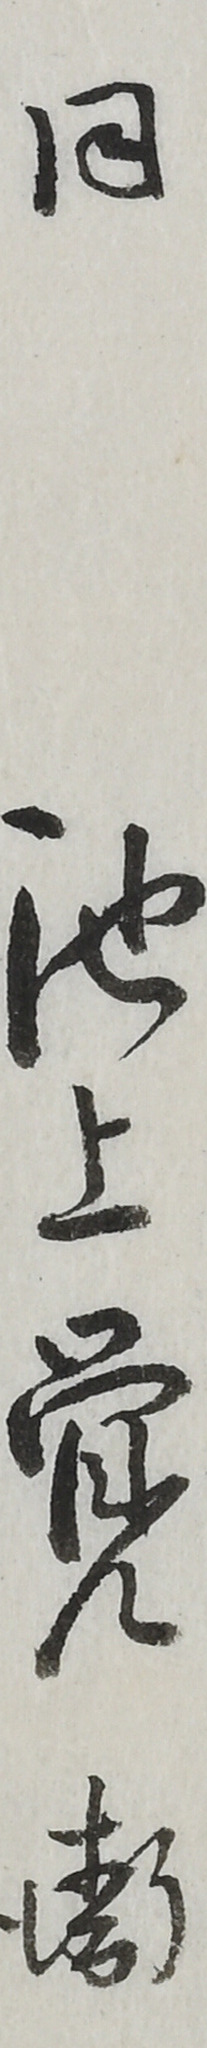同池上覚衛
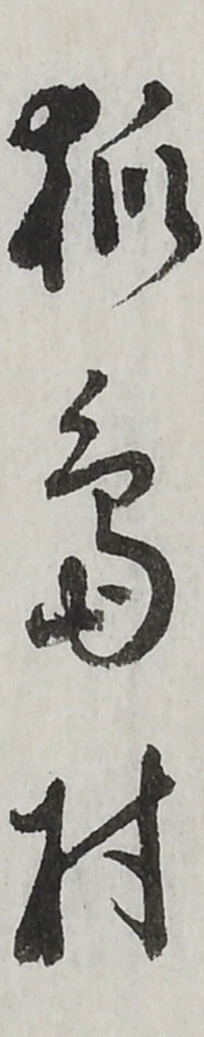狐島村
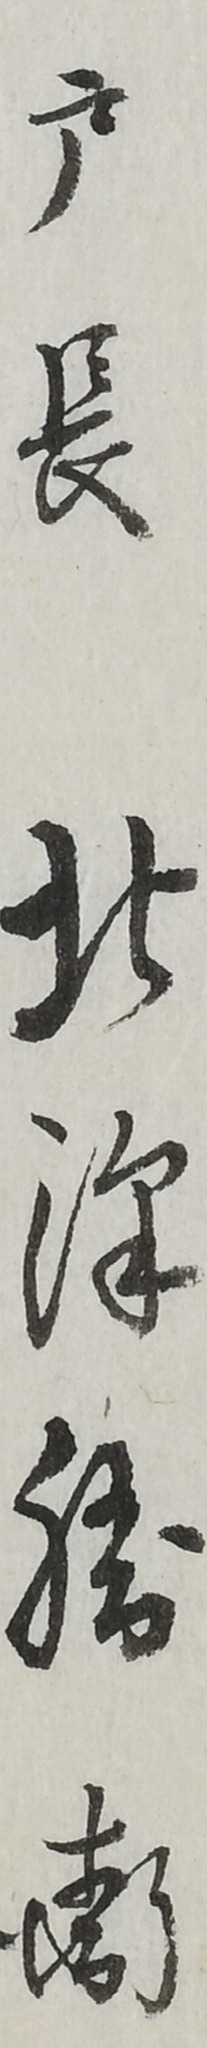戸長北澤勝衛
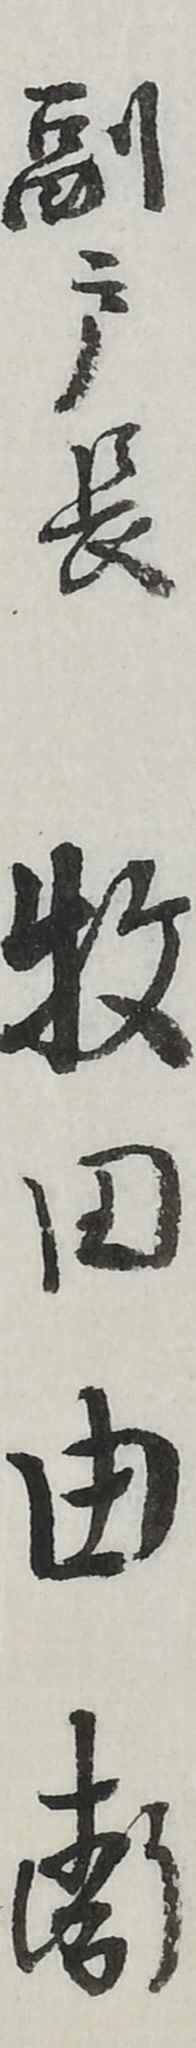副戸長牧田由衛

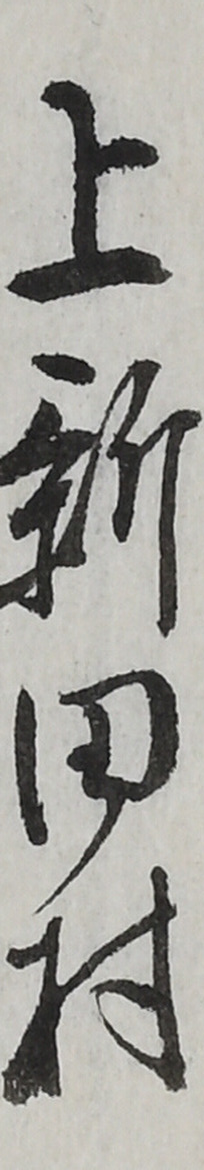上新田村
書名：伊那郡毎村戸長副戸長名簿
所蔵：伊那市立高遠町図書館・合同会社AMANE
